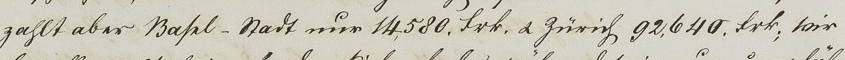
zahlt aber Basel-Stadt nur 14,580. Frk. & Zürich 92,640. Frk; wir
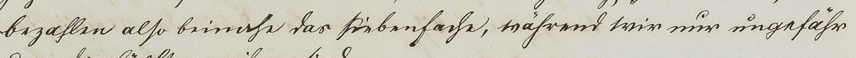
bezahlen also beinahe das Siebenfache, während wir nur ungefähr
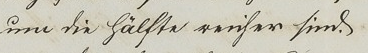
um die Hälfte reicher sind.
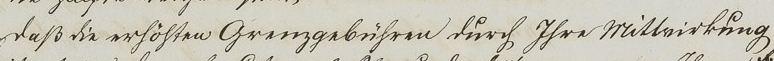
Daß die erhöhten Grenzgebühren durch Ihre Mitwirkung
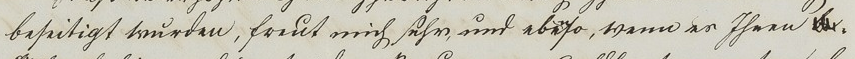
beseitigt wurden, freut mich sehr, und ebenso, wenn es Ihnen be-
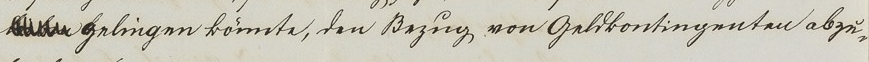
lieben gelingen könnte, den Bezug von Geldkontingenten abzu-
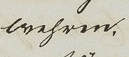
wehren.
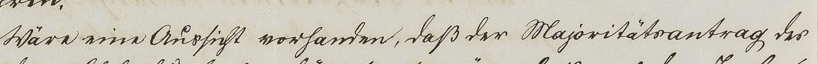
Wäre eine Aussicht vorhanden, daß der Majoritätsantrag des
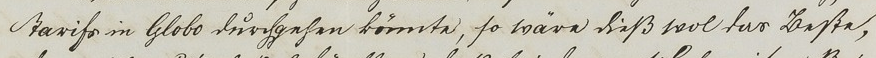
Tarifs in Globo durchgehen könnte, so wäre dieß wol das Beste,
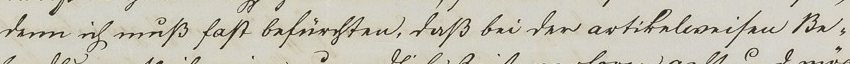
denn ich muß fast befürchten, daß bei der artikelweisen Be-
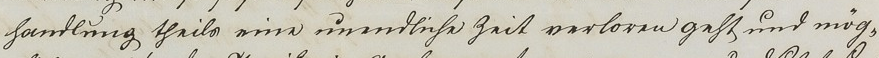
handlung theils eine unendliche Zeit verloren geht und mög-
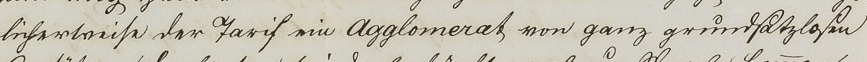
licherweise der Tarif ein Agglomerat von ganz grundsatzlosen
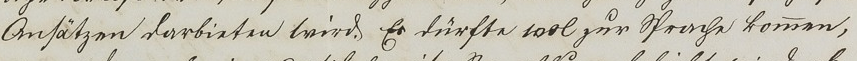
Ansätzen darbieten wird. Es dürfte wol zur Sprache kommen,
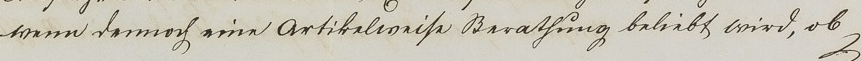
wenn dennoch eine artikelweise Berathung beliebt wird, ob
